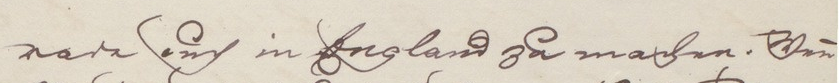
rade auch in England zu machen. Wenn
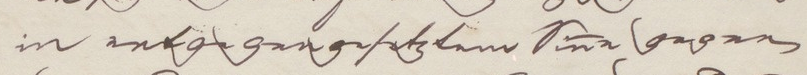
in entegengesetztem Sinne gegen
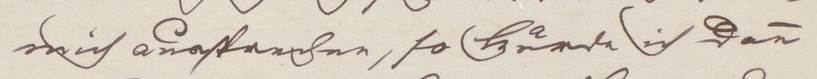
mich aussprechen, so würde ich dann
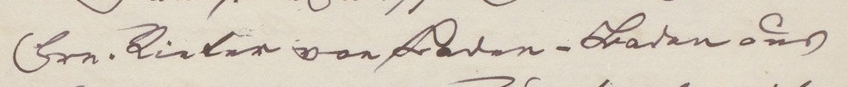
Hrn. Rieter von Baden-Baden aus
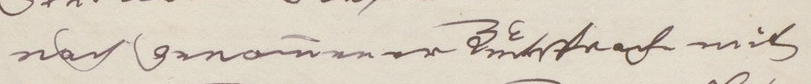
nach genommener Rücksprache mit
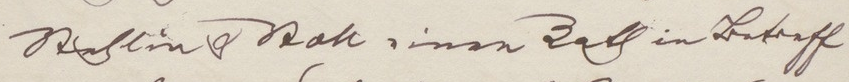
Stehlin & Stoll einen Rath in Betreff
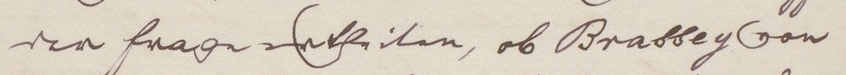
der Frage ertheilen, ob Brassey von
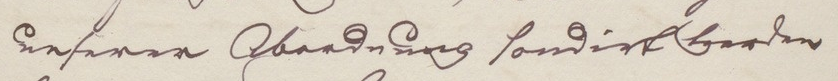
unserer Abordnung sondirt werden
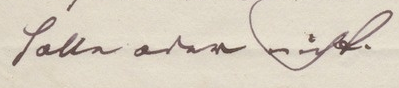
solle oder nicht.
